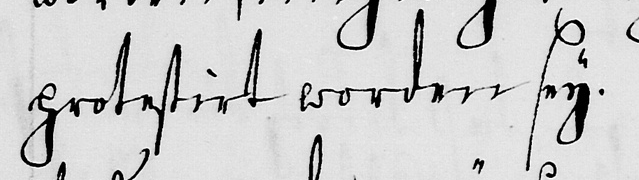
protestirt worden sey.
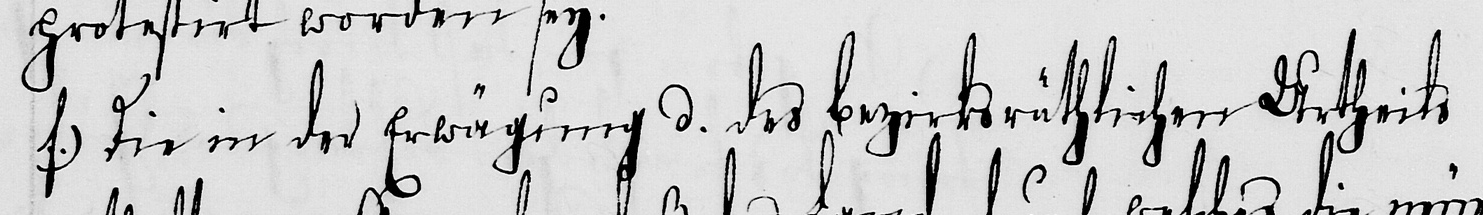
f.) Die in der Erwägung d. des bezirksräthlichen Urtheils
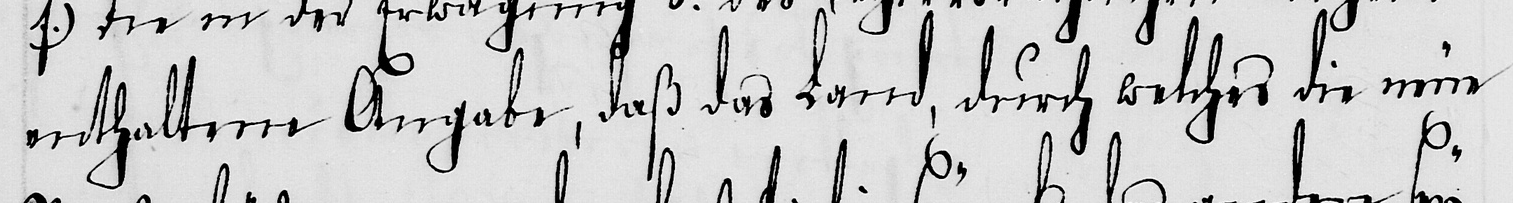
enthaltene Angabe, daß das Land, durch welches die neue
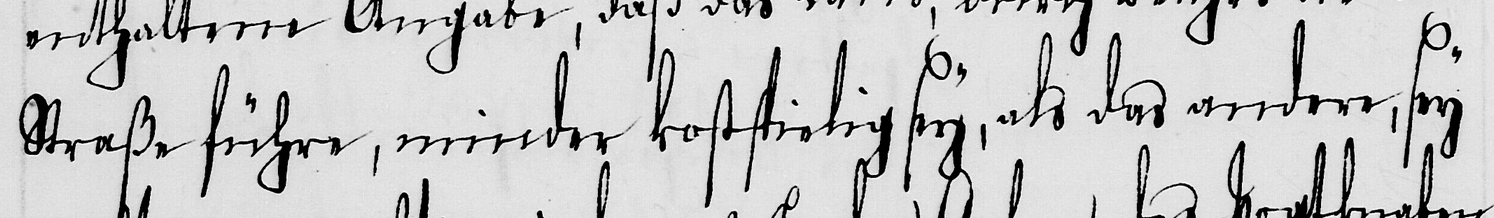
Straße führe, minder kostspielig sey, als das andere, sey
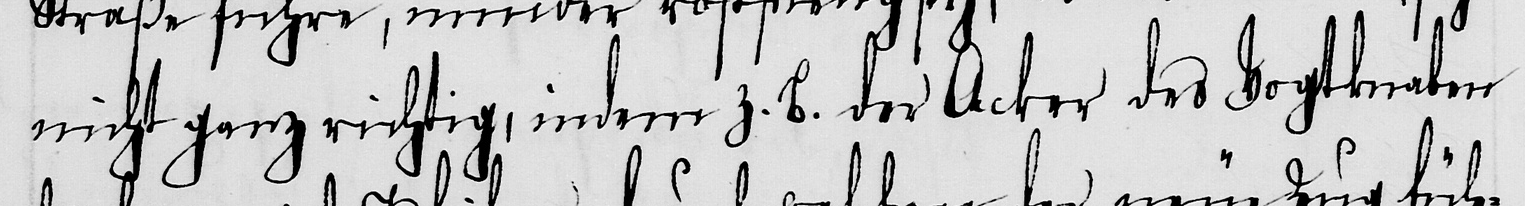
nicht ganz richtig, indem z.B. der Acker des Vogtknaben
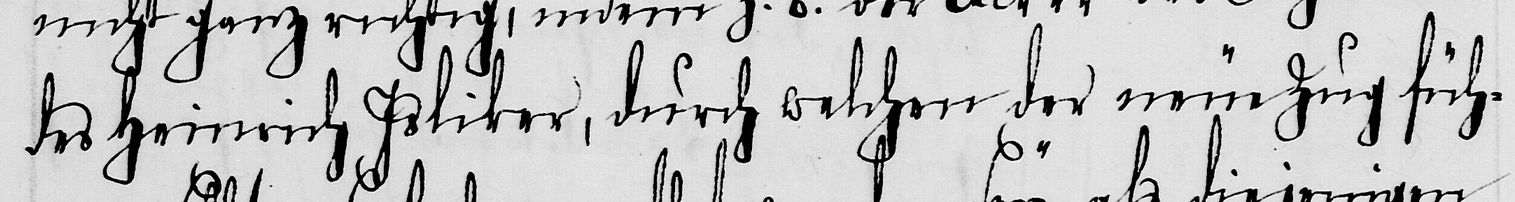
des Heinrich Isliker, durch welchen der neue Zug füh¬
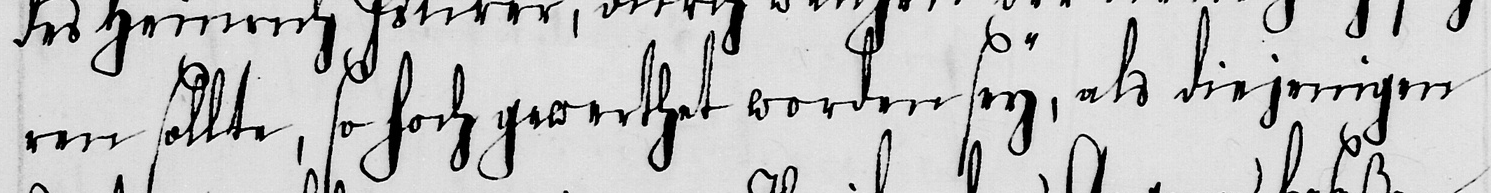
ren sollte, so hoch gewerthet worden sey, als diejenigen
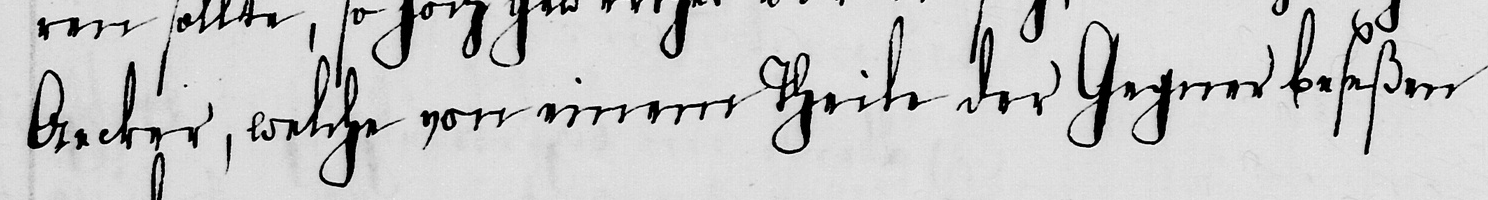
Aecker, welche von einem Theile der Gegner beseßen
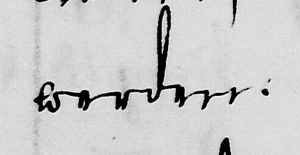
werden.
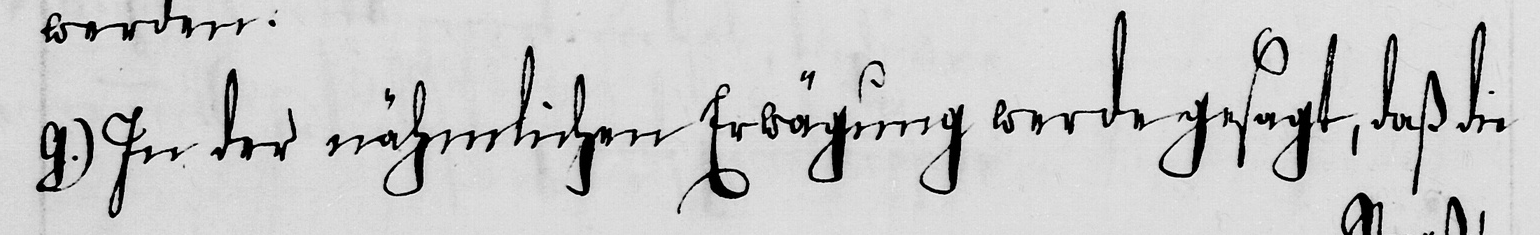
g.) In der nähmlichen Erwägung werde gefragt, daß die
